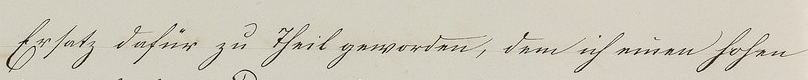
Ersatz dafür zu Theil geworden, dem ich einen hohen
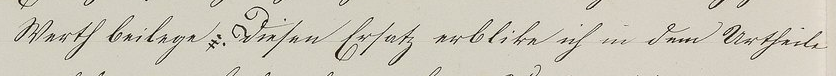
Werth beilege. Diesen Ersatz erblike ich in dem Urtheile
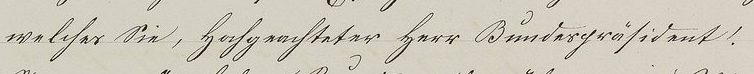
welches Sie, Hochgeachteter Herr Bundespräsident!
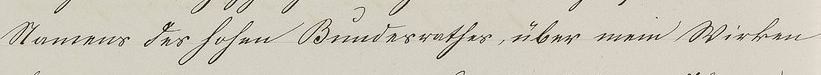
Namens des hohen Bundesrathes, über mein Wirken
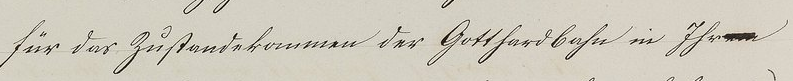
für das Zustandekommen der Gotthardbahn in Ihrem
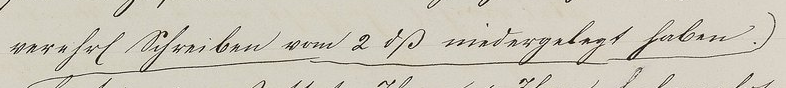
verehrlichen Schreiben vom 2 dß niedergelegt haben.
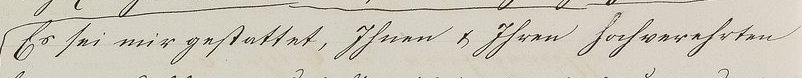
Es sei mir gestattet, Ihnen & Ihren hochverehrten
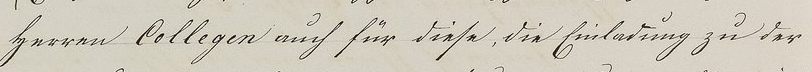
Herren Collegen auch für diese, die Einladung zu der
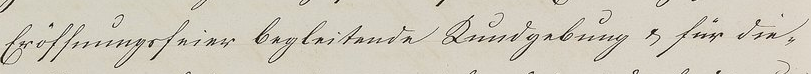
Eröffnungsfeier begleitende Kundgebung & für die-
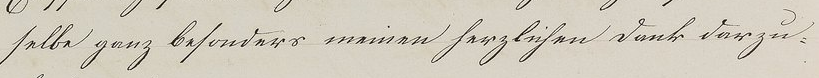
selbe ganz besonders meinen herzlichen Dank darzu-
